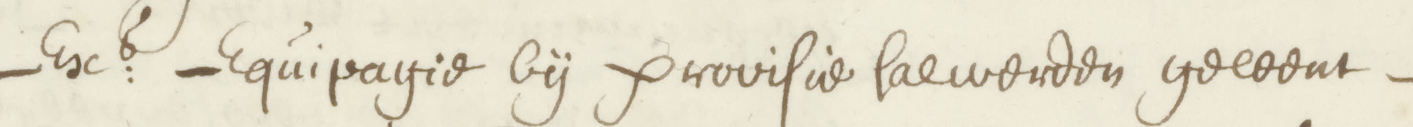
Exs. Equipagie bij provisie sal werden geleent
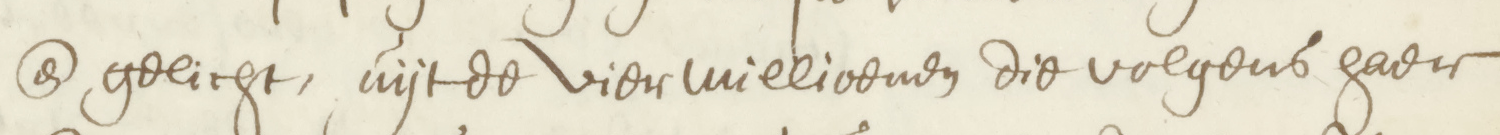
& gelicht, uijt de vier millioenen die volgens haer
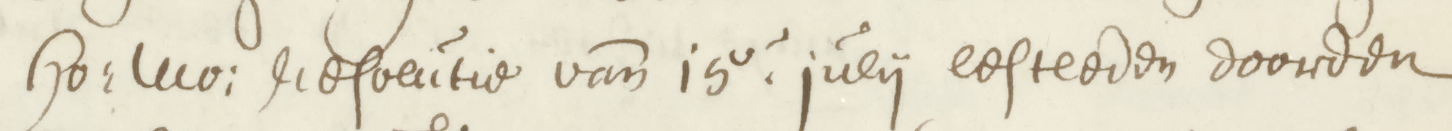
Ho:Mo: resolutie van 15e. julij lestleden doorden
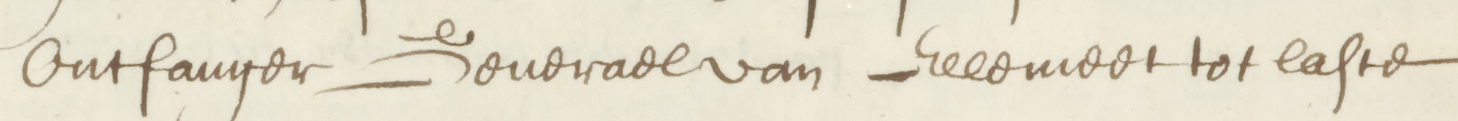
Ontfanger Generael van Ellemeet tot laste
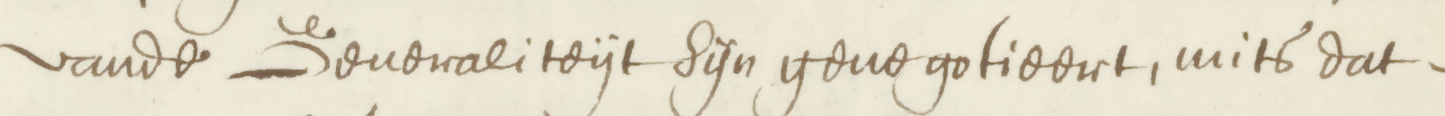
vande Generaliteijt sijn genegotieert, mits dat
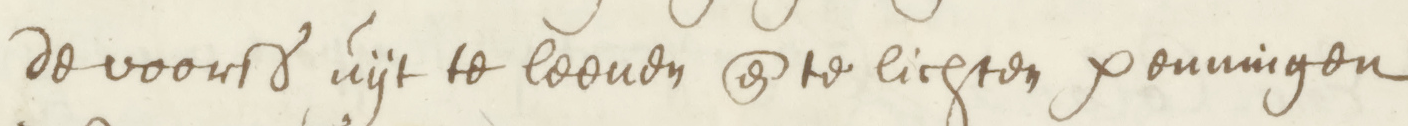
de voors uijt te leenen & te lichten penningen
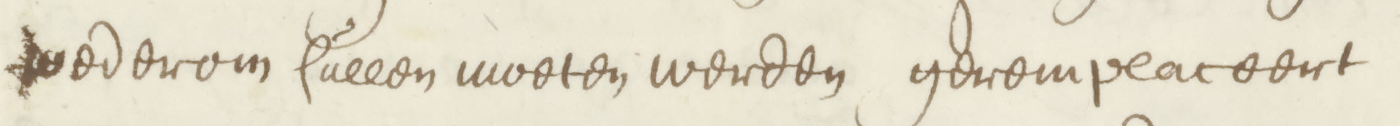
wederom sullen moeten werden geremplaceert
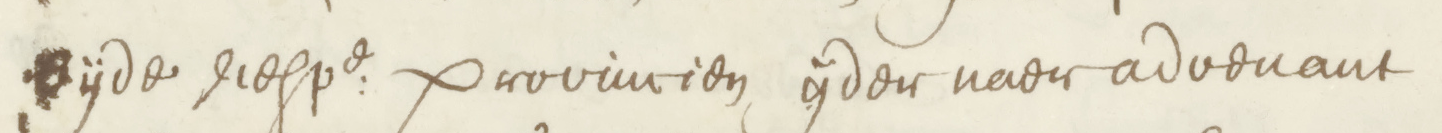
bijde respe provincien ijder naer advenant
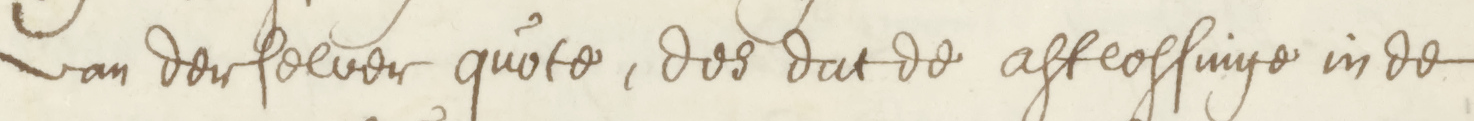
van derselver quote, des dat de afflossinge in de
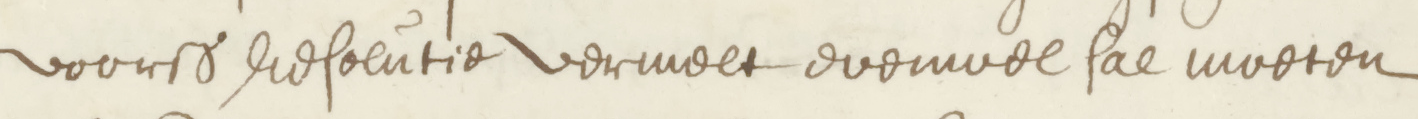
voors resolutie vermelt evenwel sal moeten
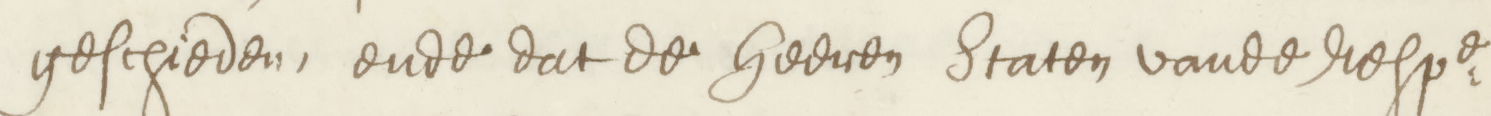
geschieden, ende dat de heeren Staten vande respe.
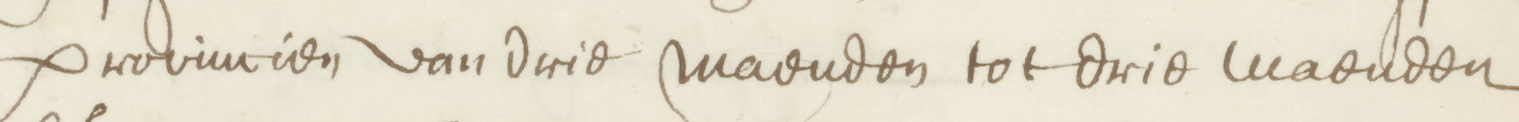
provincien van drie maenden tot drie maenden
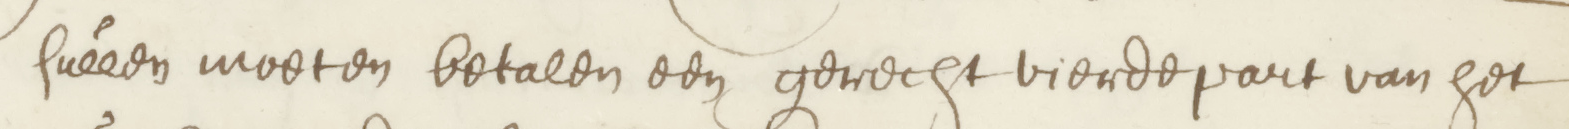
sullen moeten betalen een gerecht vierde part van het
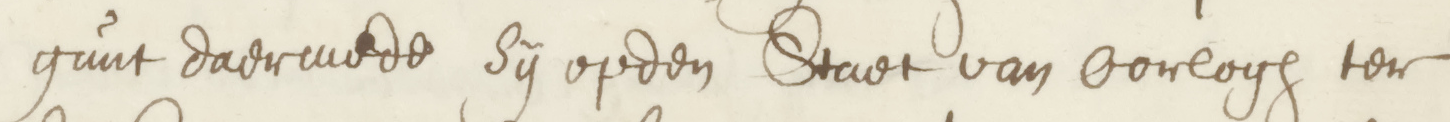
gunt daermede sij opden Staet van oorlogh ter
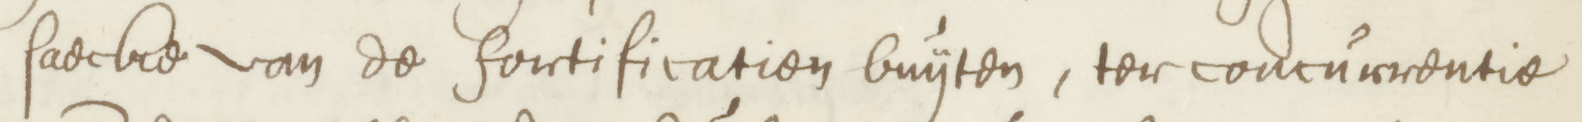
saecke van de fortificatien buijten, ter concurrentie
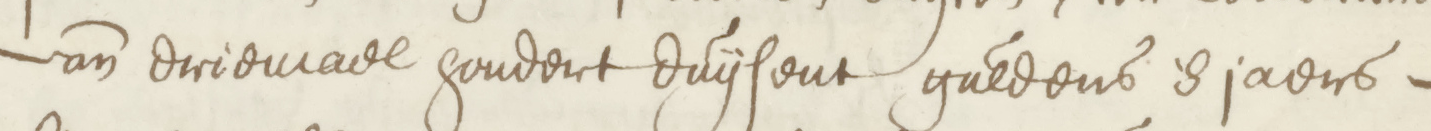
van driemael hondert duijsent guldens 's jaers
